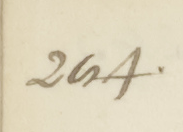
284.
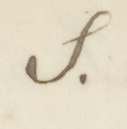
S.
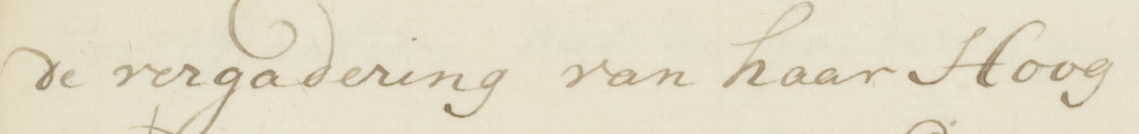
de vergadering van haar Hoog
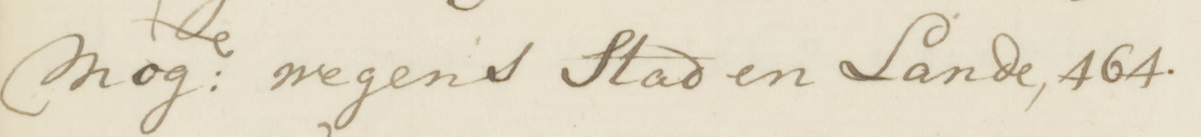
Moge: wegens Stad en Lande, 464.
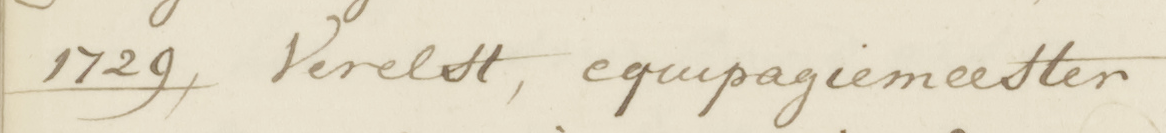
1729, Verelst, equipagiemeester
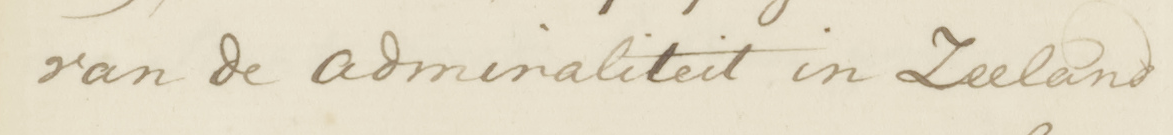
van de admiraliteit in Zeeland
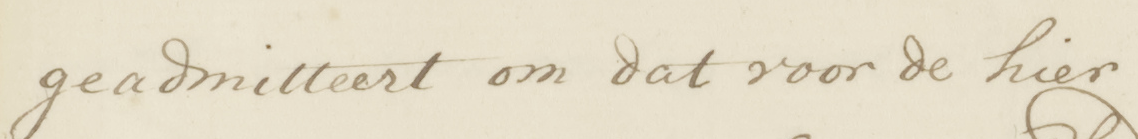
geadmitteert om dat voor de hier
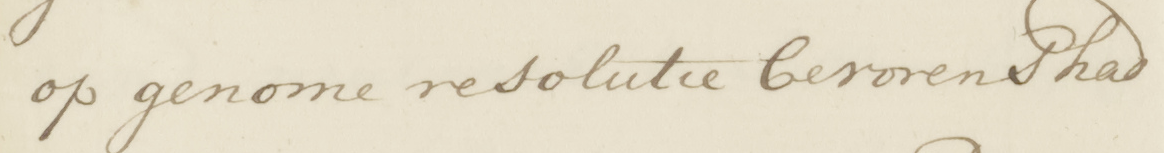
op genome resolutie bevorens had
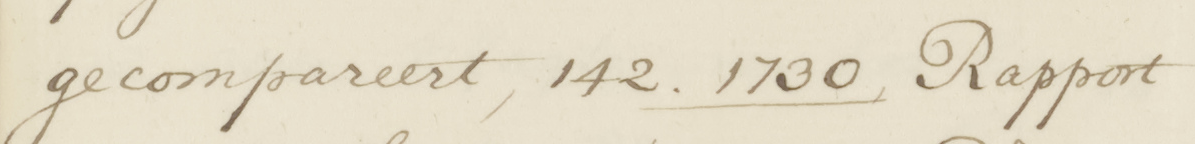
gecompareert, 142. 1730, Rapport
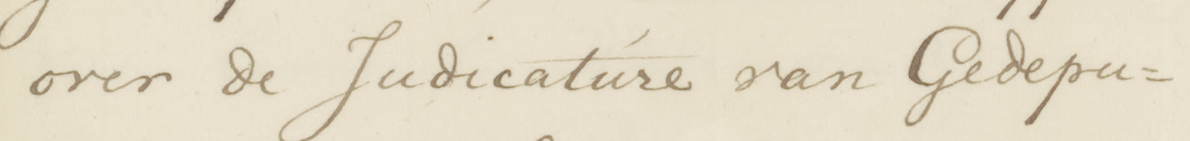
over de Judicature van Gedepu=
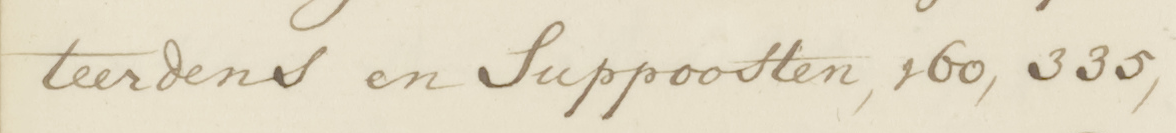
teerdens en Suppoosten, 160, 335,
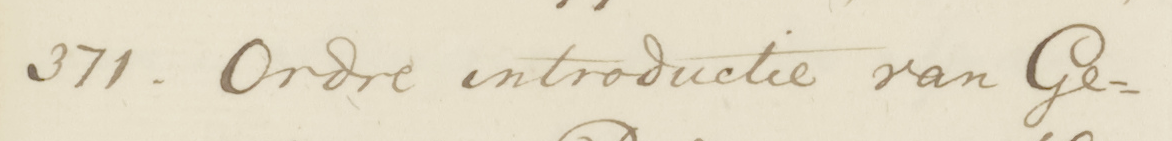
371. Ordre introductie van Ge=
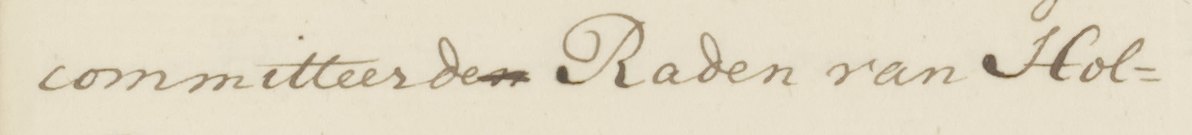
committeerden Raden van Hol=
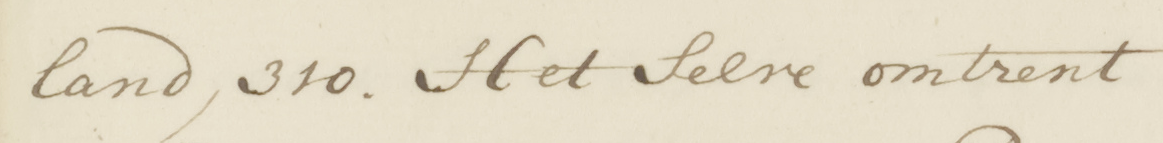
land, 310. Het selve omtrent
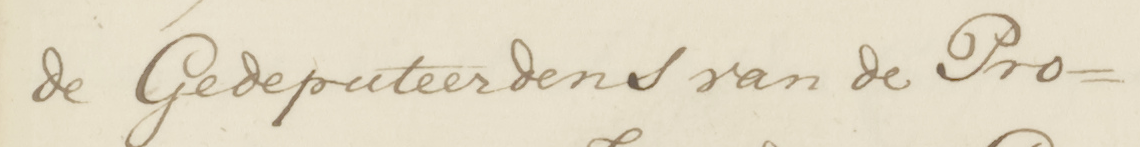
de Gedeputeerdens van de Pro=
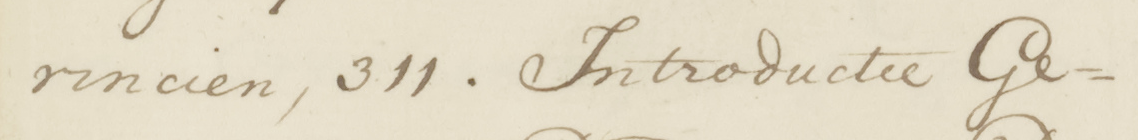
vincien, 311. Introductie Ge=
